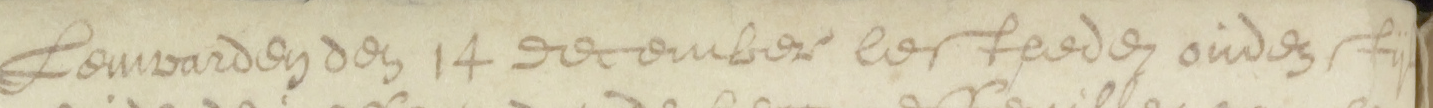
Leuwarden den 14 december lestleden ouden stijl
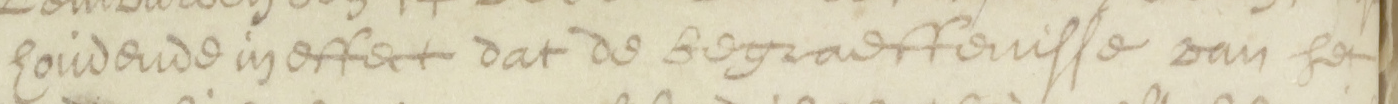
houdende in effect dat de begraeffenisse van het
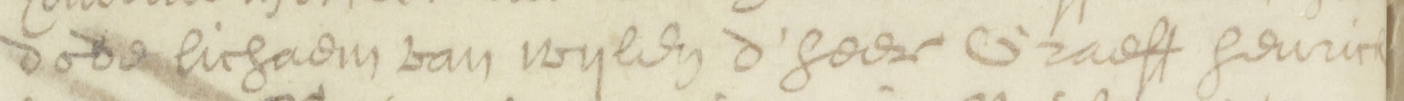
dode lichaem van wylen d'heer Graeff henrick
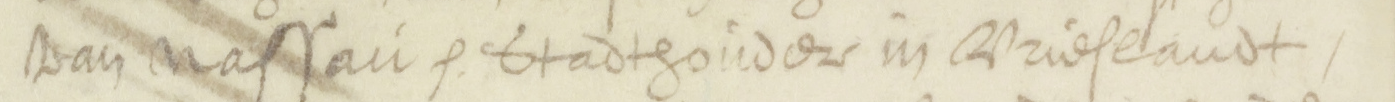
van Nassau s. Stadthouder in Vrieslandt,
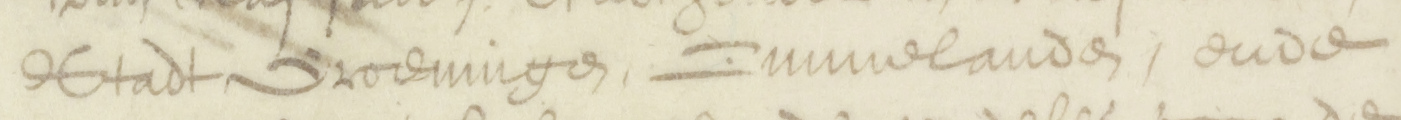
Stadt Groeningen, Ommelanden, ende
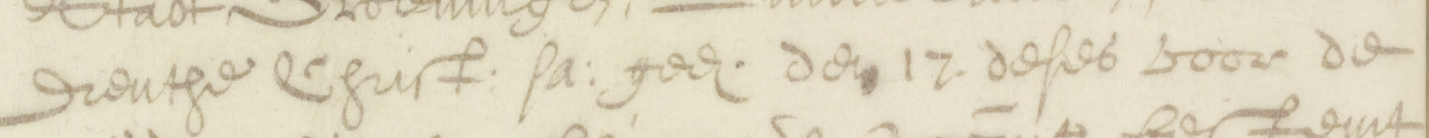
Drenthe Christ: sa: gee. den 17. deses voor de
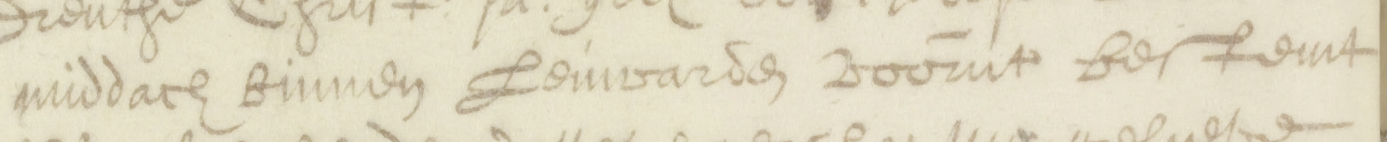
middach binnen Leuwarden voornt bestemt
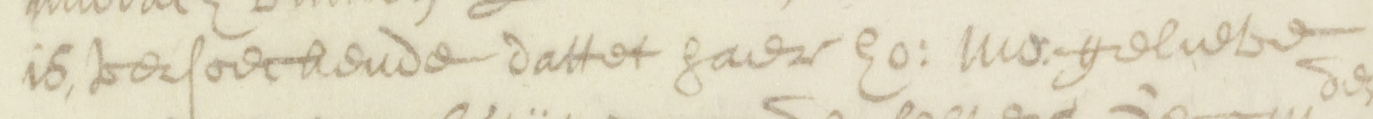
is, versoeckende dattet haer ho:Mo: gelieve
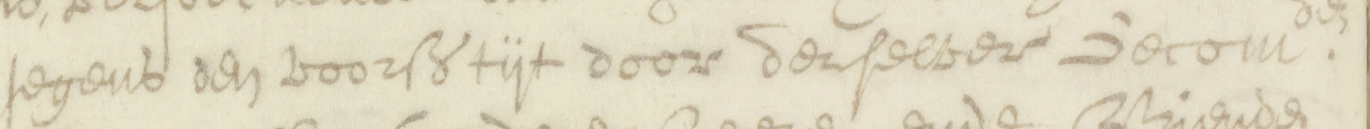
jegens den voors tijt door derselver Gecomden.
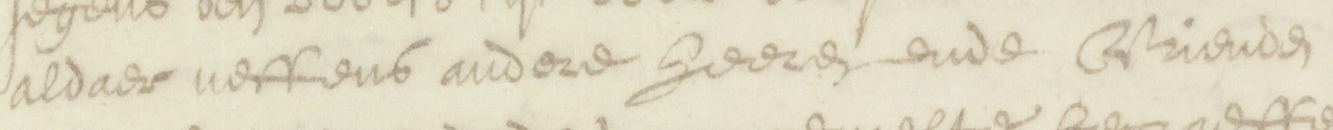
aldaer neffens andere heeren ende Vrienden
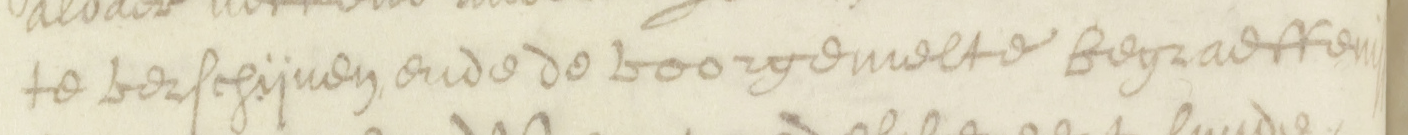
te verschijnen ende de voorgemelte begraeffenisse
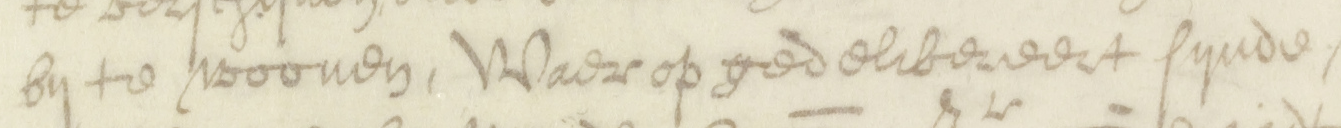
by te woonen. Waer op gedelibereert synde,
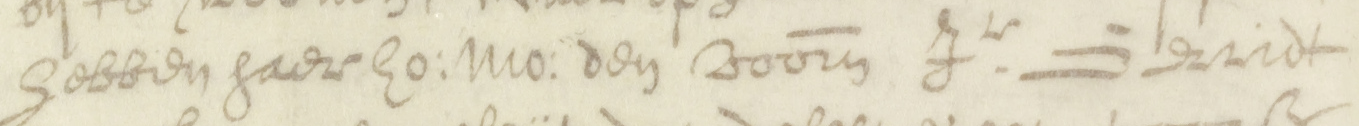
hebben haer ho:Mo: den voorn Jr. Gerridt
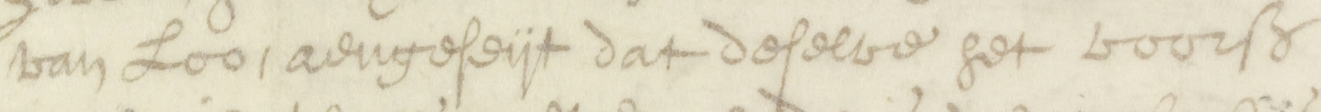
van Loo, aengeseijt dat deselve het voors
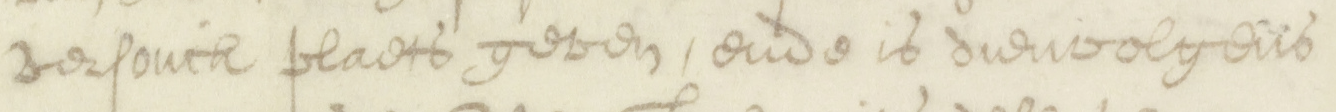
versouck plaets geven, ende is dienvolgens
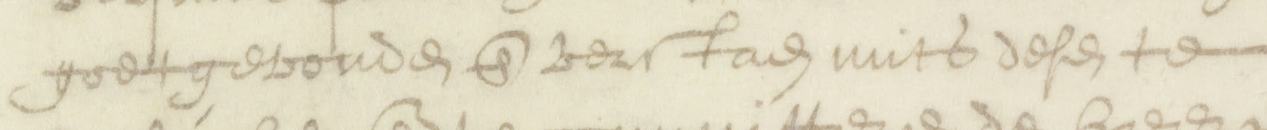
goetgevonden & verstaen mits desen te
